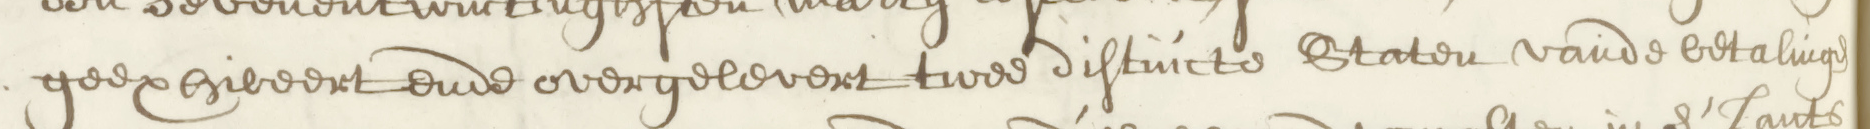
geexhibeert ende overgelevert twee distincte Staten vande betalinge
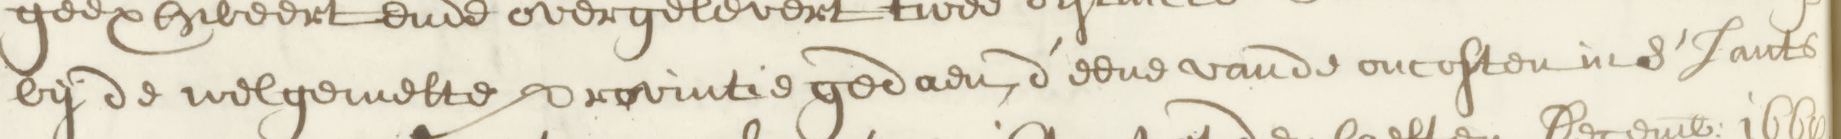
bij de welgemelte provintie gedaen, d'eene vande oncosten in s'Lants
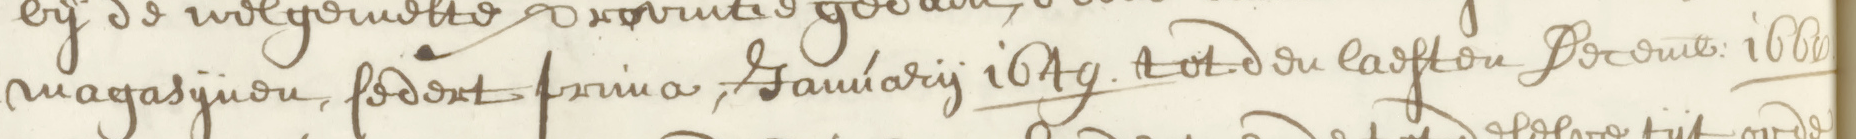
magasijnen, sedert prima, Januarij 1649. tot den laesten Decemb: 1660
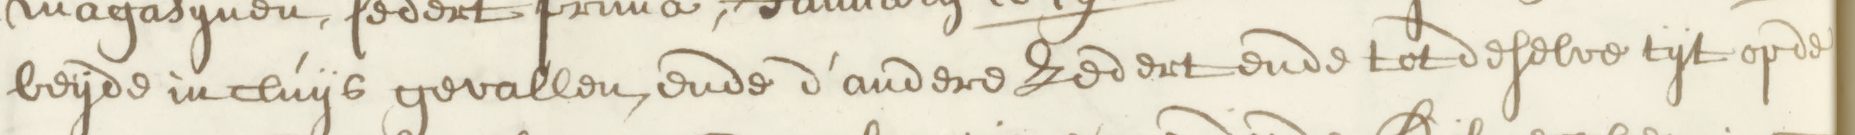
beijde incluijs gevallen ende d'andere Zedert ende tot deselve tijt opde
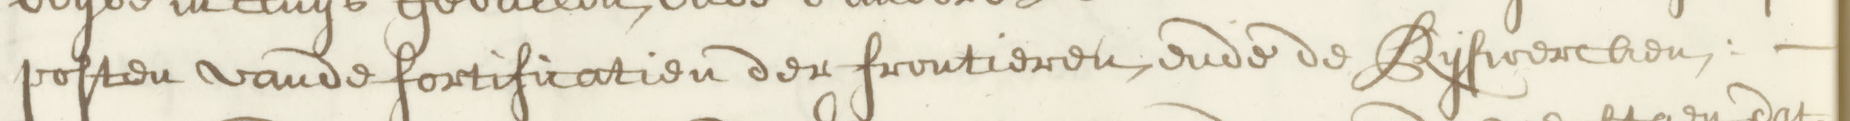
posten vande fortificatien der frontieren ende de Rijswercken: —
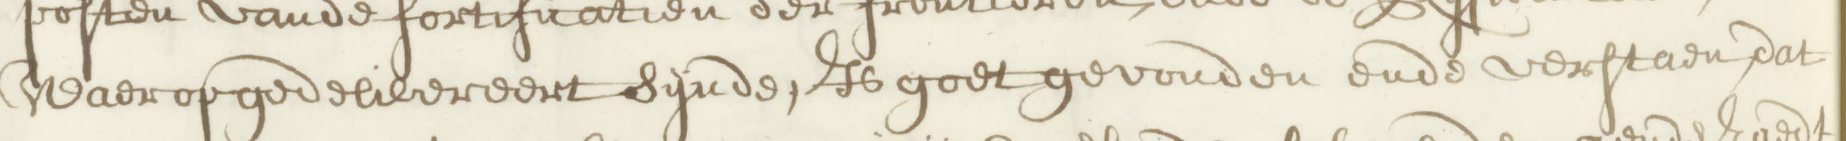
Waerop gedelibereert sijnde, Is goetgevonden ende verstaen dat
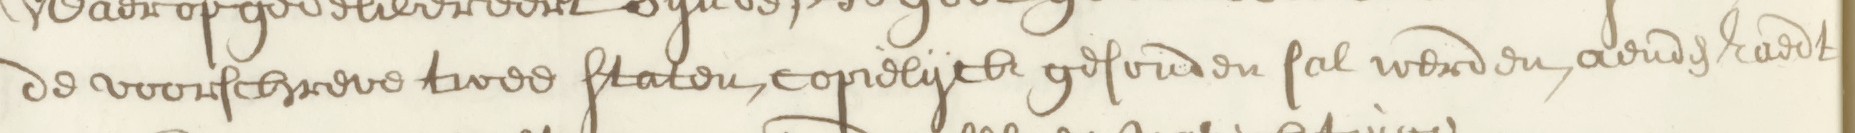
de voorschreve twee staten copielijck gesonden sal werden aenden raedt
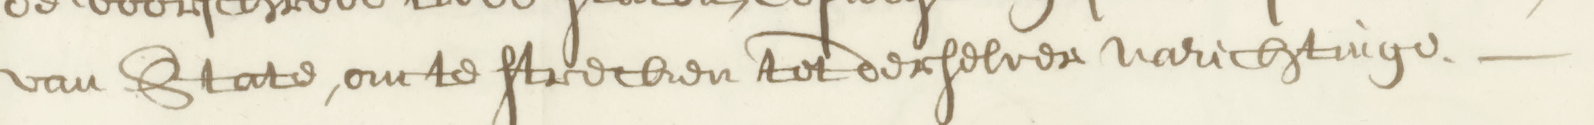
van State, om te strecken tot derselven narichtinge. —
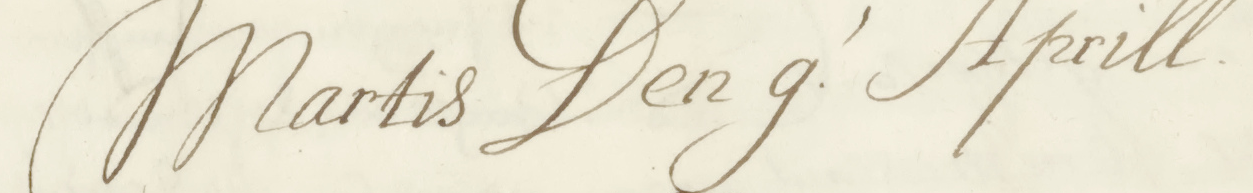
Martis Den 9’. Aprill.
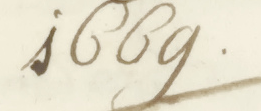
1669.
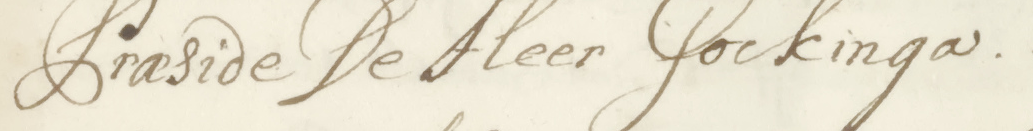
Præside De Heer Gockinga.
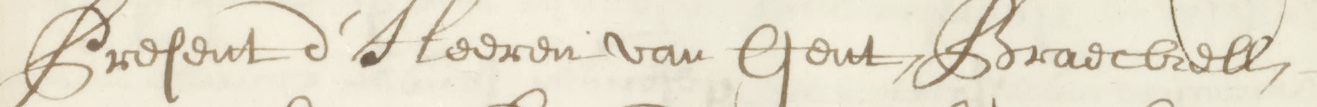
Present d'Heeren van Gent, Braeckell,
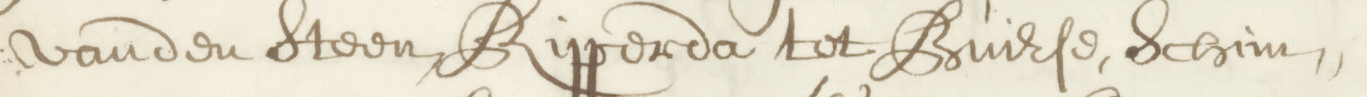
vanden Steen, Ripperda tot Buirse, Schim„
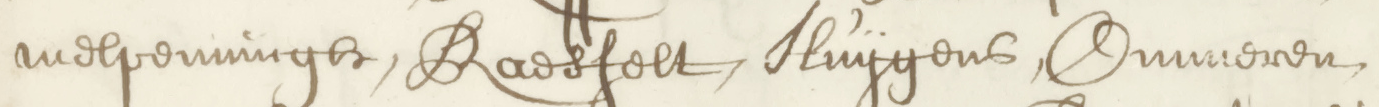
melpenningh, Raesfelt, Huijgens, Ommeren,
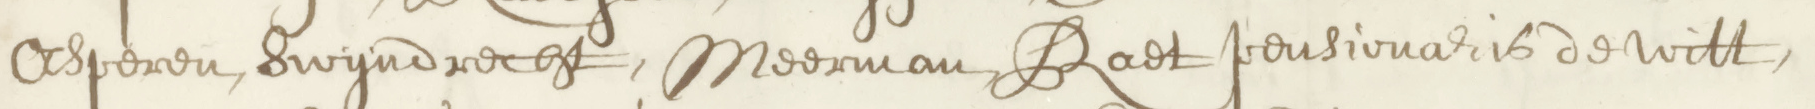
Asperen, Swijndrecht, Meerman, Raet pensionaris de witt,
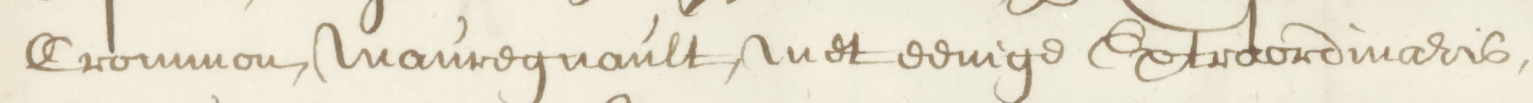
Crommon, Mauregnault, met eenige Extraordinaris,
